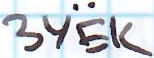зуёк
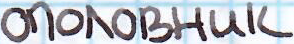ополовник
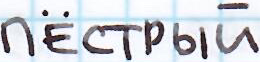пёстрый
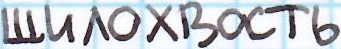шилохвость
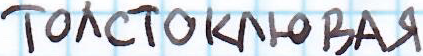толстоклювая
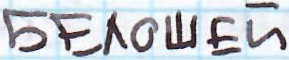белошей
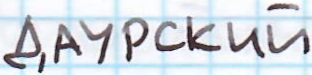даурский
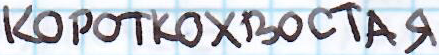короткохвостая
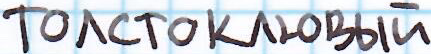толстоклювый
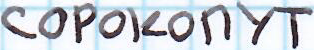сорокопут
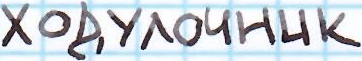ходулочник
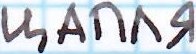цапля
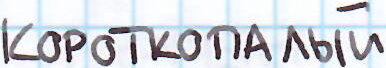короткопалый
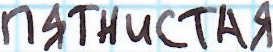пятнистая
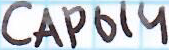сарыч
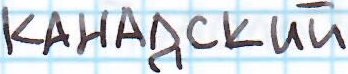канадский
